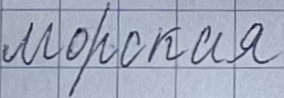морская
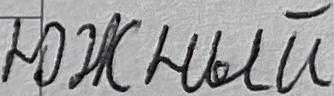южный
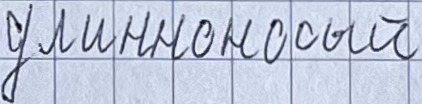длинноносый
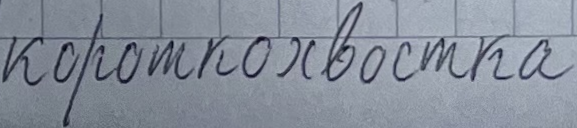короткохвостка
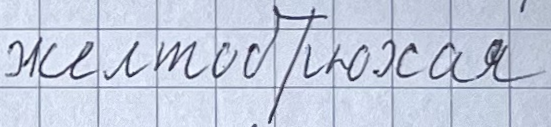желтобрюхая
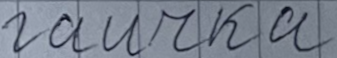гаичка
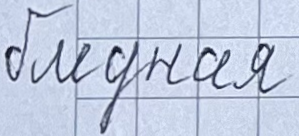бледная
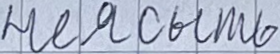неясыть
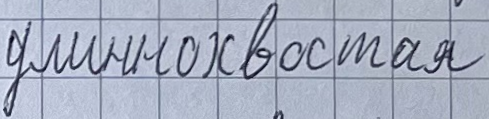длиннохвостая
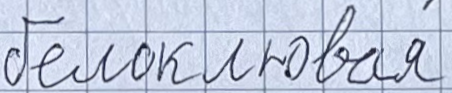белоклювая
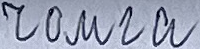чомга
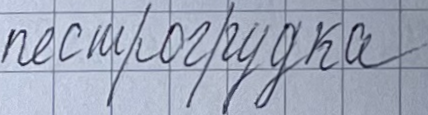пестрогрудка
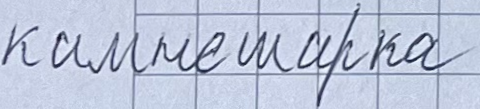камнешарка
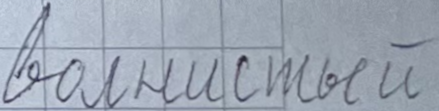волнистый
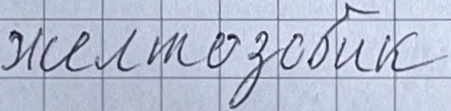желтозобик
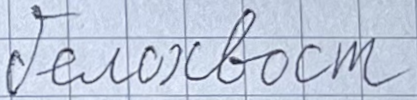белохвост
